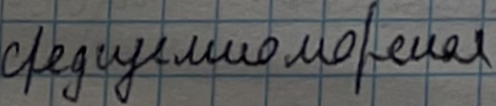средиземноморская
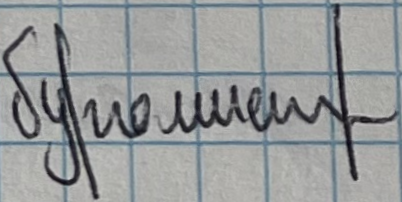бургомистр
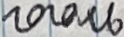гоголь
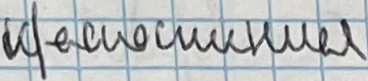красноспинная
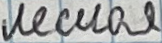лесная
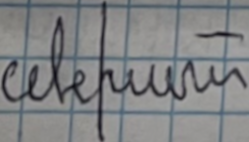северный
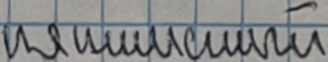пятнистый
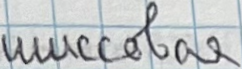тиссовая
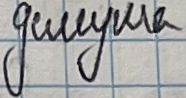дикуша
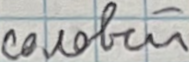соловей
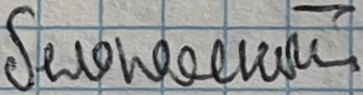белопоясный
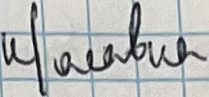красавка
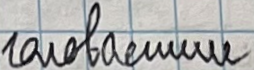головастик
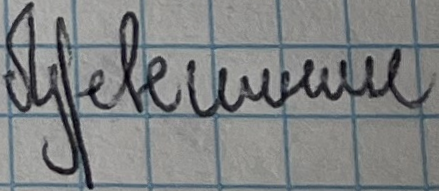буревестник
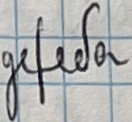деряба
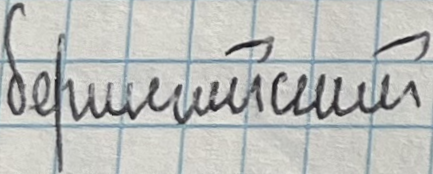берингийский
